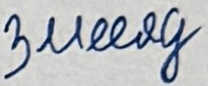змееяд
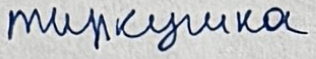тиркушка
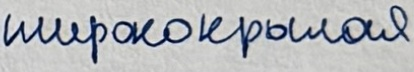ширококрылая
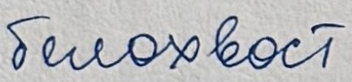белохвост
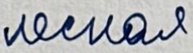лесная
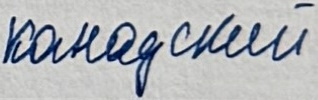канадский
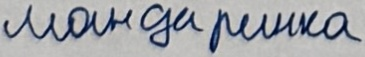мандаринка
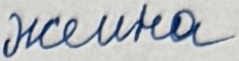желна
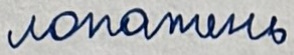лопатень
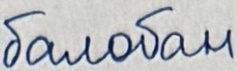балобан
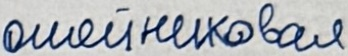ошейниковая
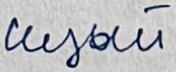сизый
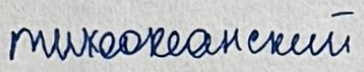тихоокеанский
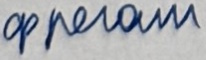фрегат
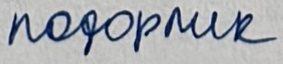подорлик
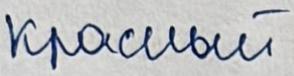красный
